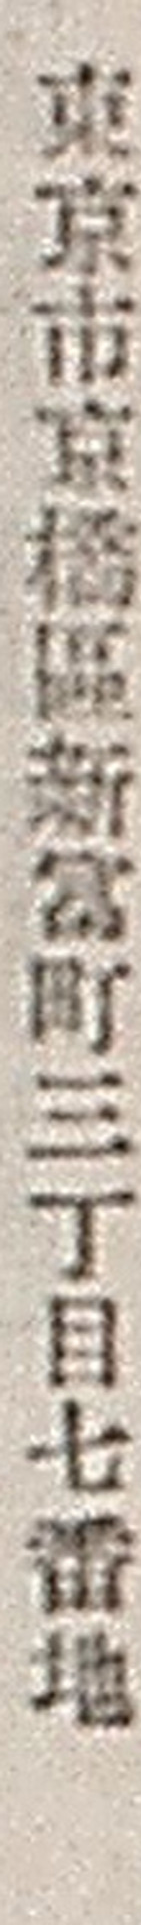東京市京橋区新富町三丁目七番地
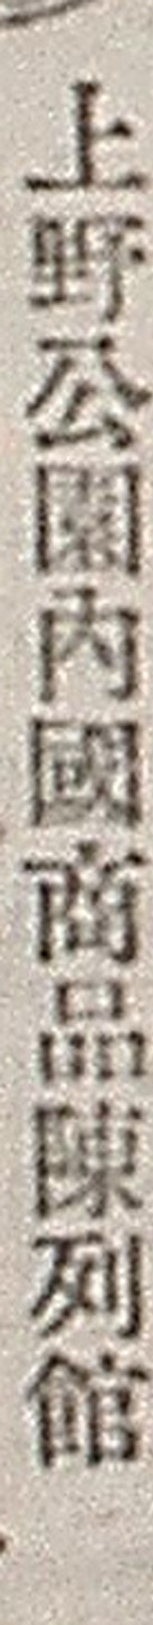上野公園内国商品陳列館
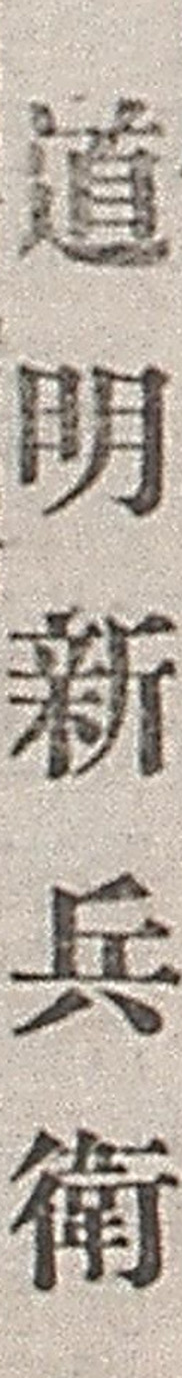道明新兵衛
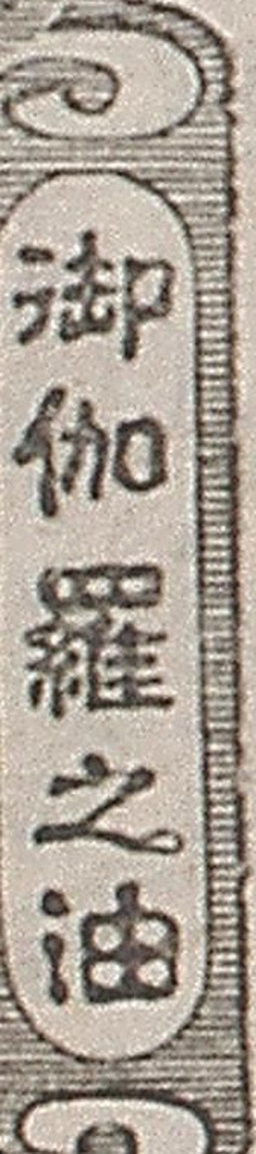御伽羅之油
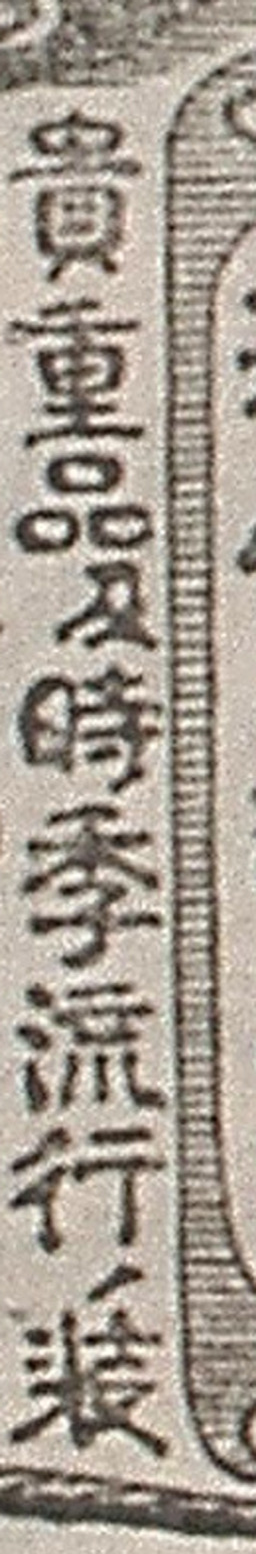貴重品及時季流行ノ装
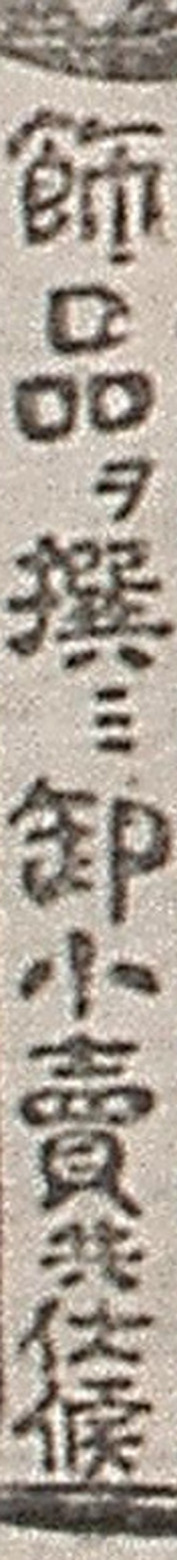飾品ヲ撰ミ御小売共仕候
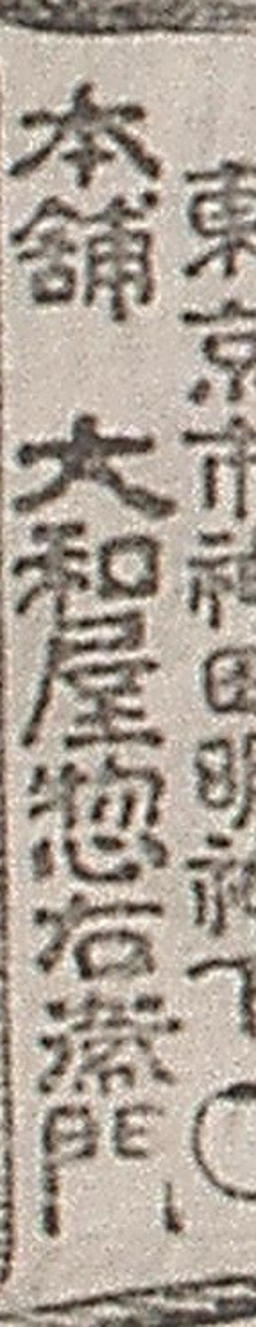本舗大和屋惣右衛門
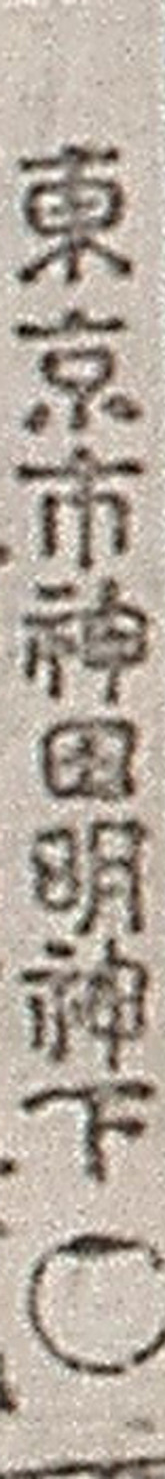東京市神田明神下〇
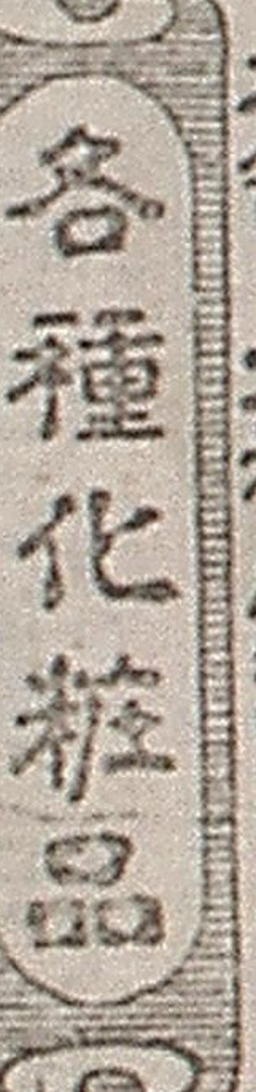各種化粧品

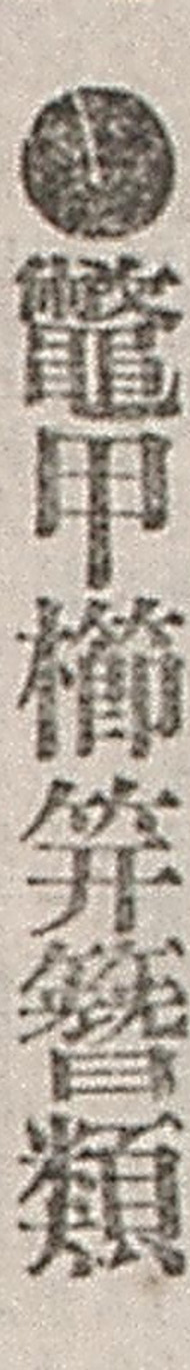●鼈甲櫛笄簪類
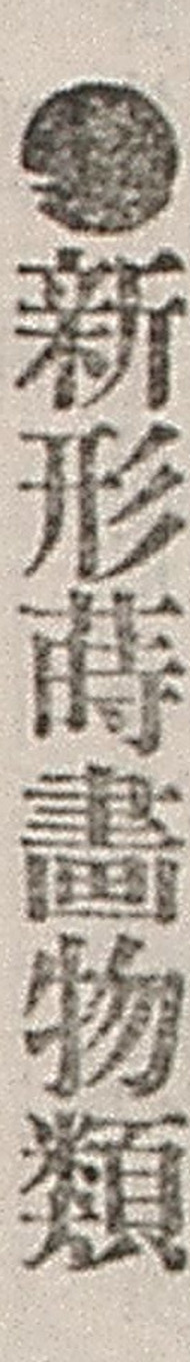●新形蒔画物類
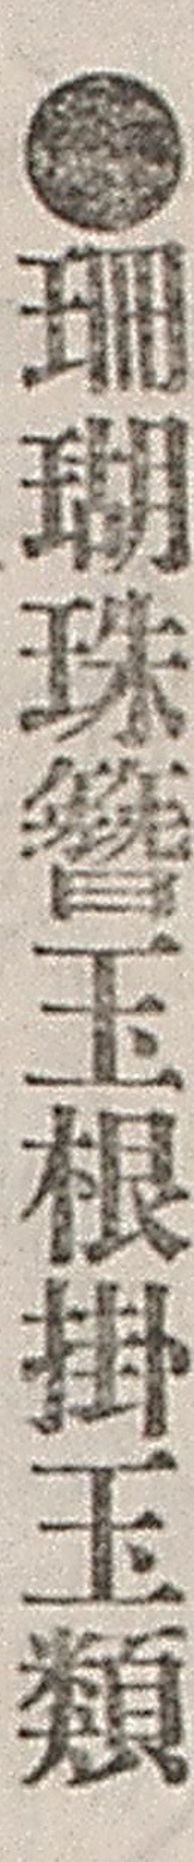●珊瑚珠簪玉根掛玉類
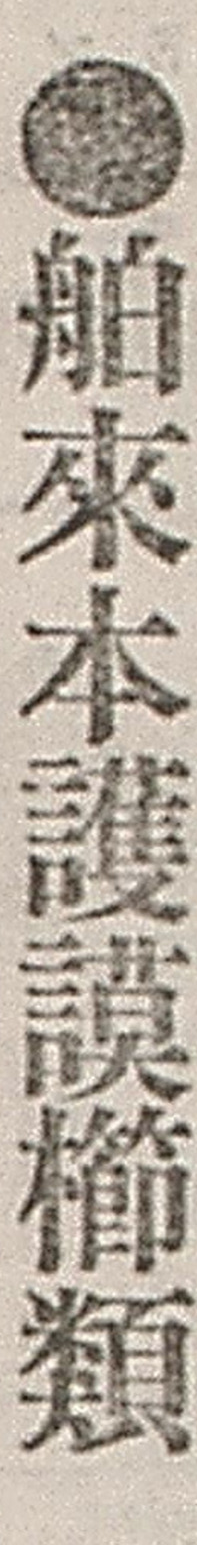●舶来本護謨櫛類
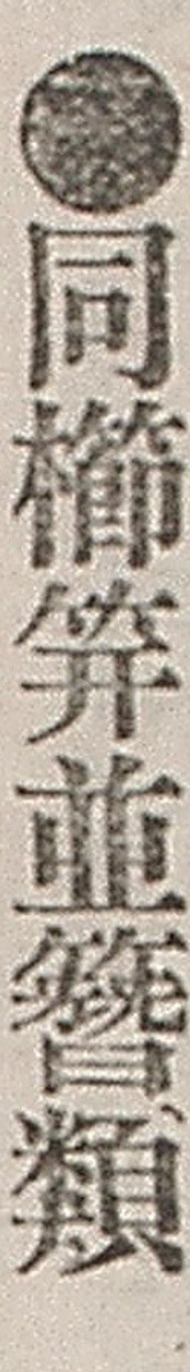●同櫛笄亜簪類
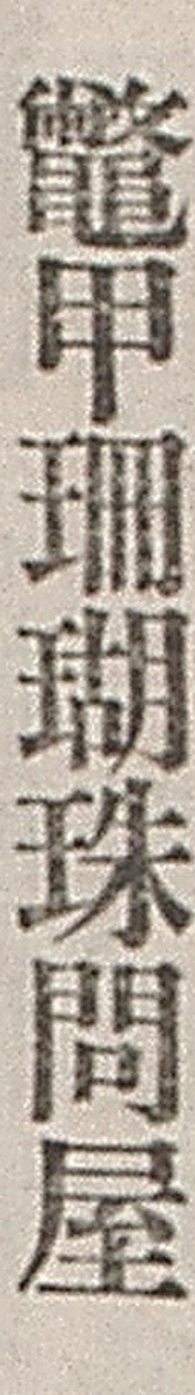鼈甲珊瑚珠問屋
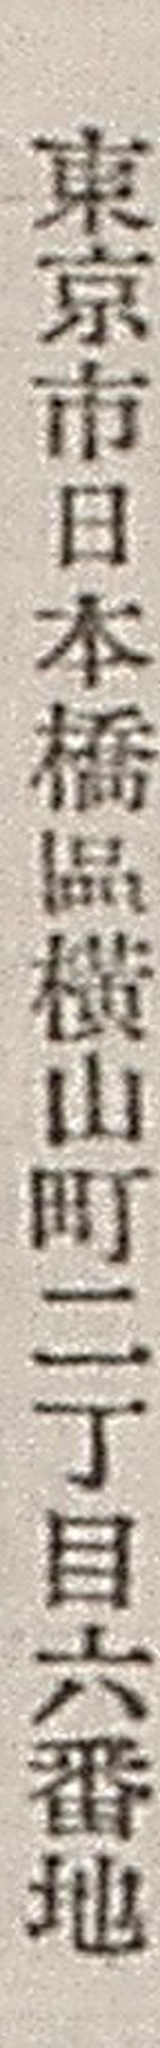東京市日本橋区横山町二丁目六番地
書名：風俗畫報臨時増刊第百二十四號　洪水地震被害録（上）
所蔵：東京大学地震研究所図書室 Earthquake Research Institute Library, The University of Tokyo, JAPAN
